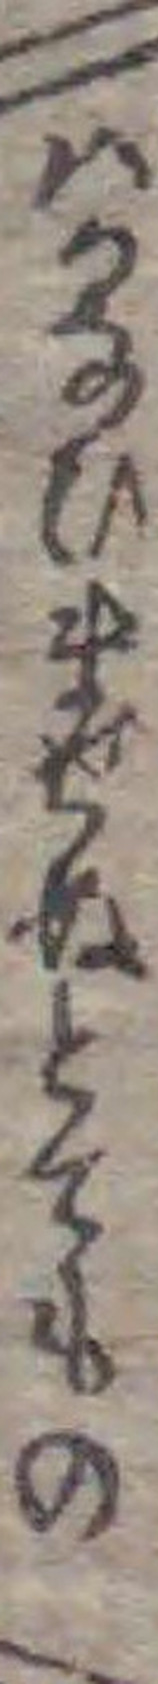はかなひませぬとてもの
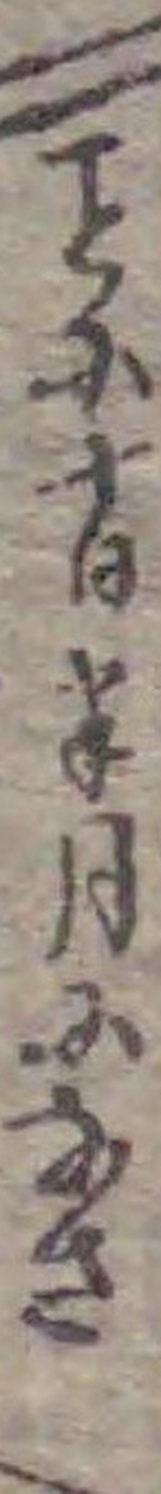ことに十日半月になさ
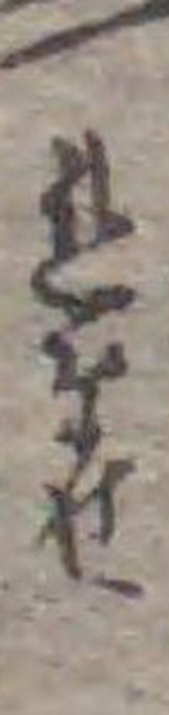れませ

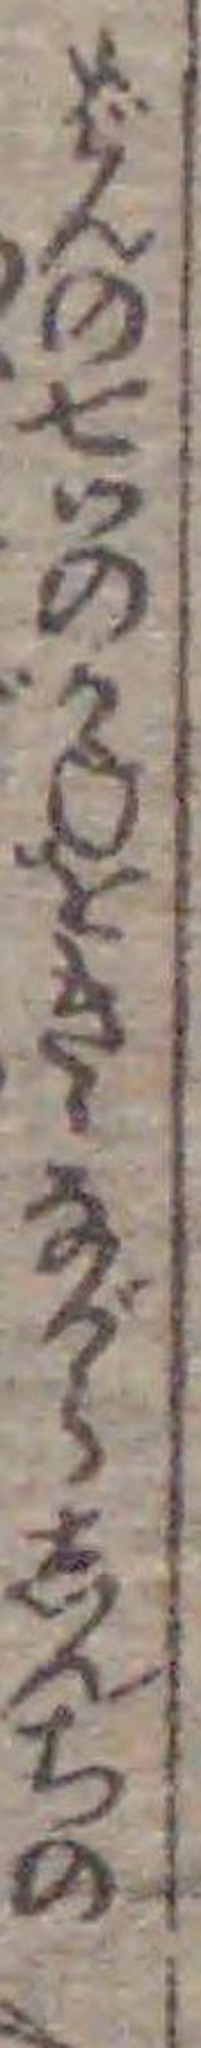ばんの七ツのかねをきゝながらしんちの
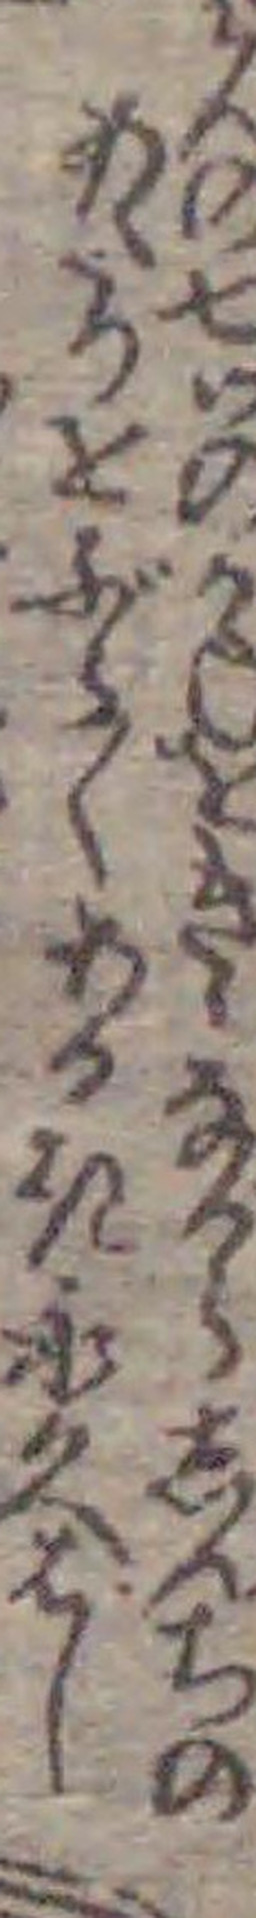あたりをぶら〳〵あるき永久はし
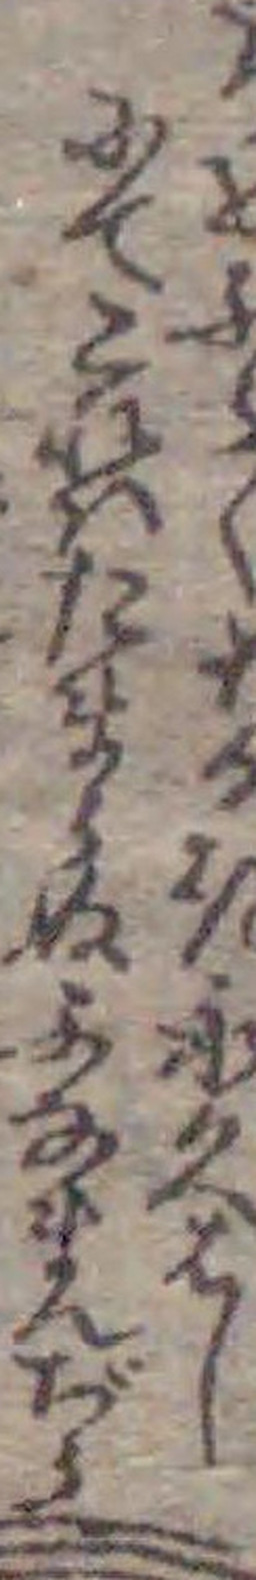にてこれはたまらぬふなまんぢう
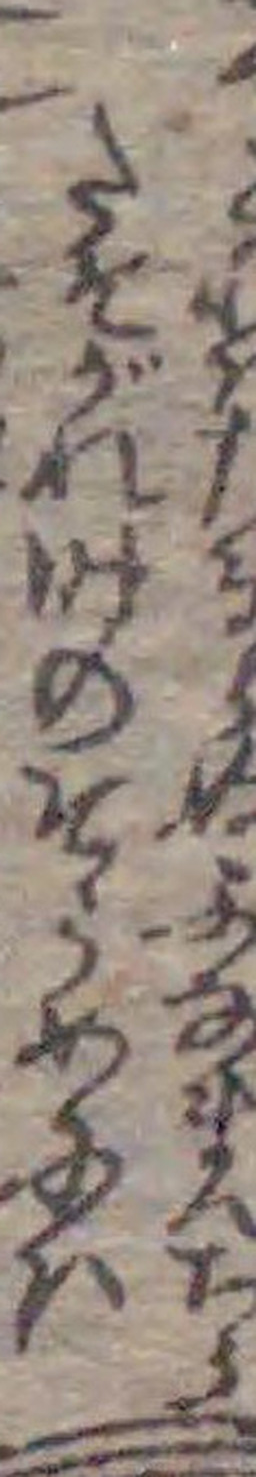たそがれ時のそらめには
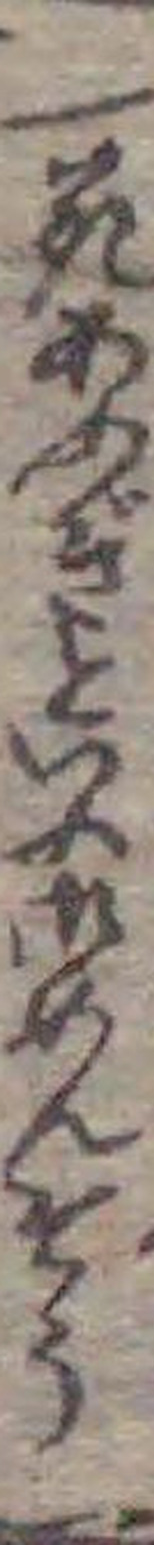花あふぎといふ御めんそう
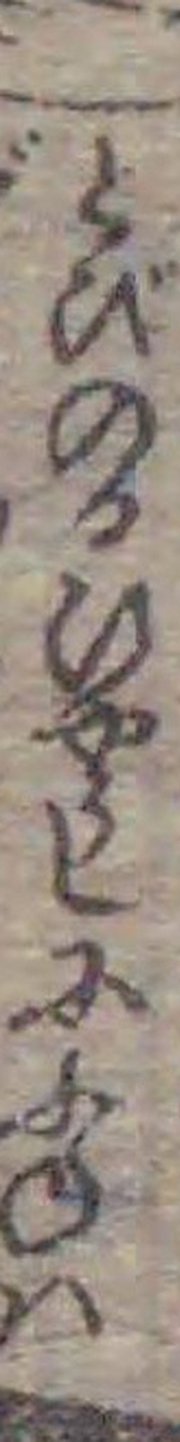とびのるひやうしにふねは
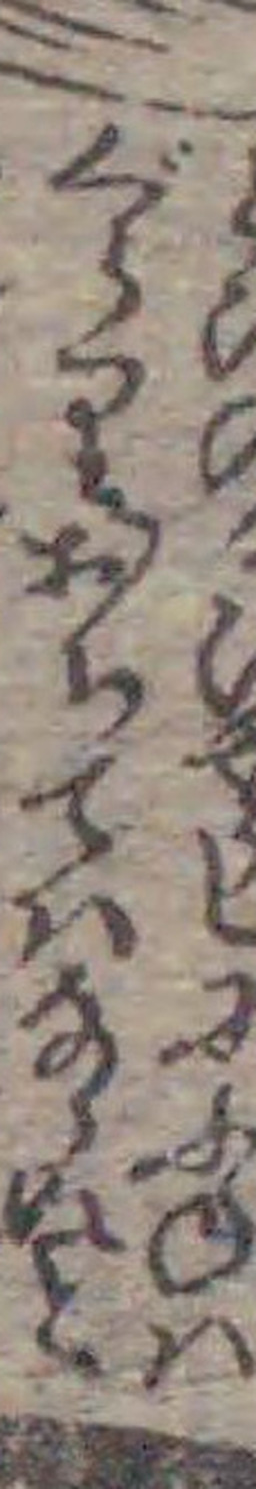ぐらりおちてはならぬと
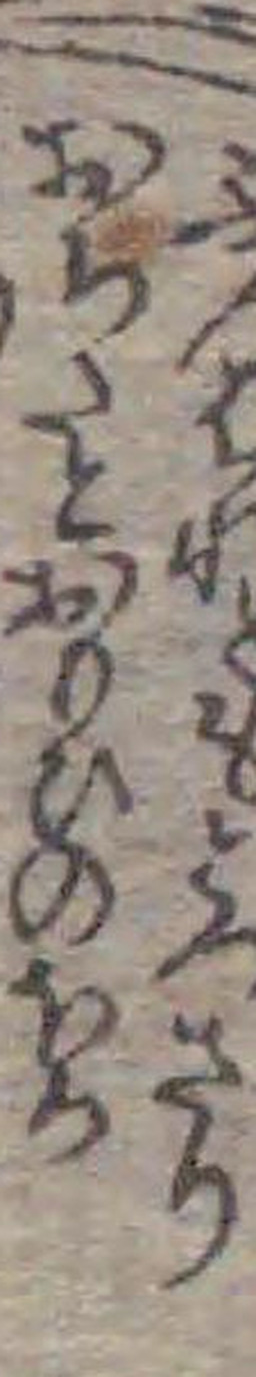おちたとおもひのほか
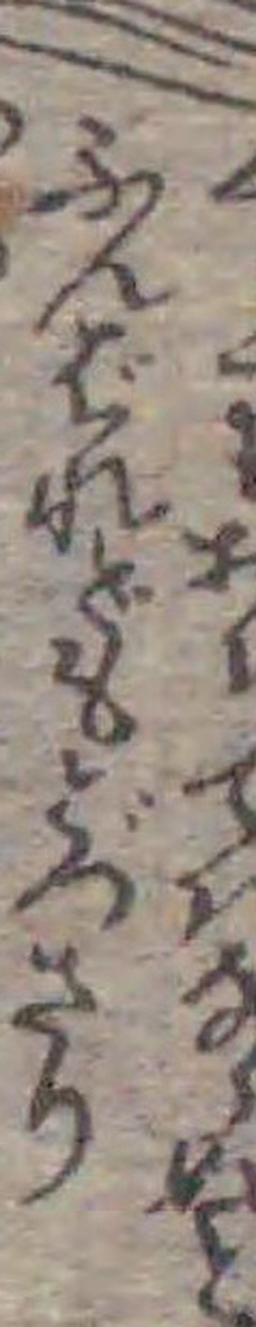ふんばれどもどつさり
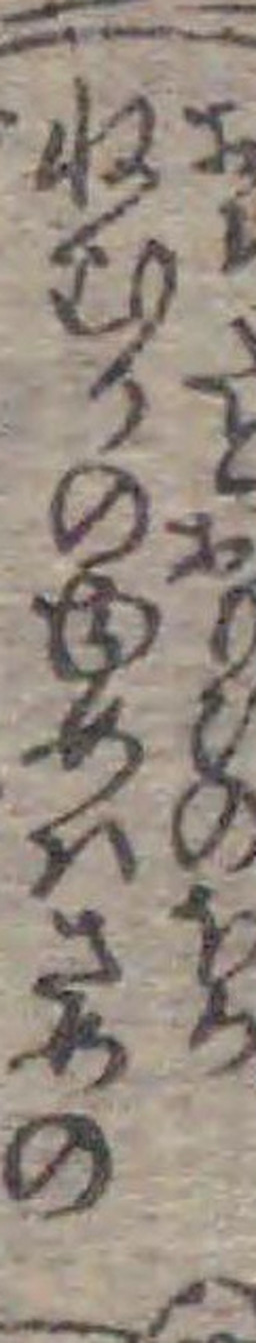ねむりのゆめはさめの
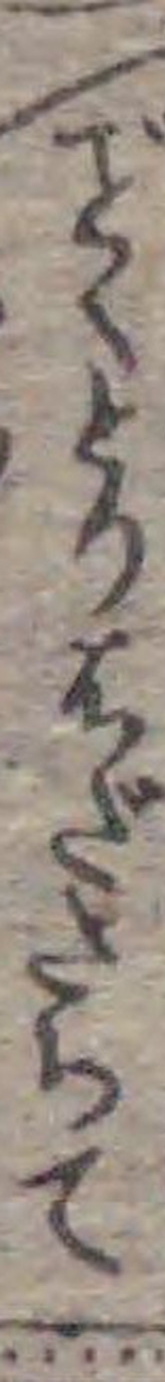ごとくとりはだたちて
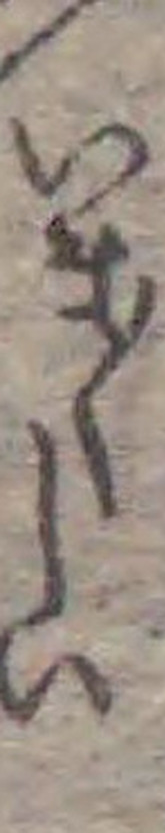いま〳〵しい
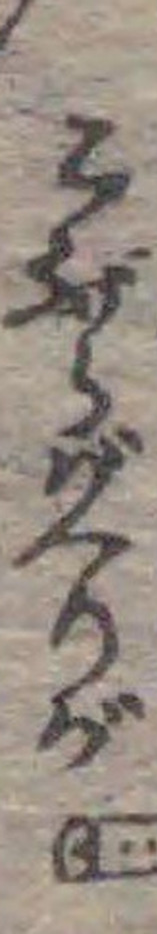こぶらがへりが
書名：見徳一炊夢 : 3巻
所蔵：国立国会図書館 National Diet Library, JAPAN
